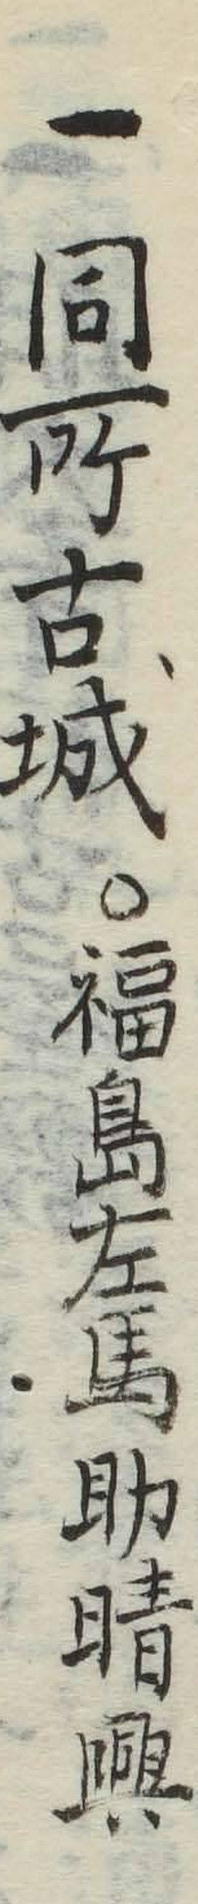一同所古城○福島左馬助晴興
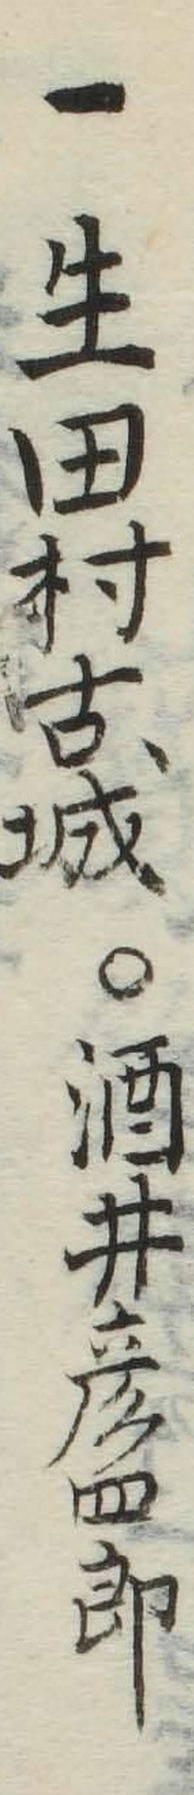一生田村古城○酒井彦次郎
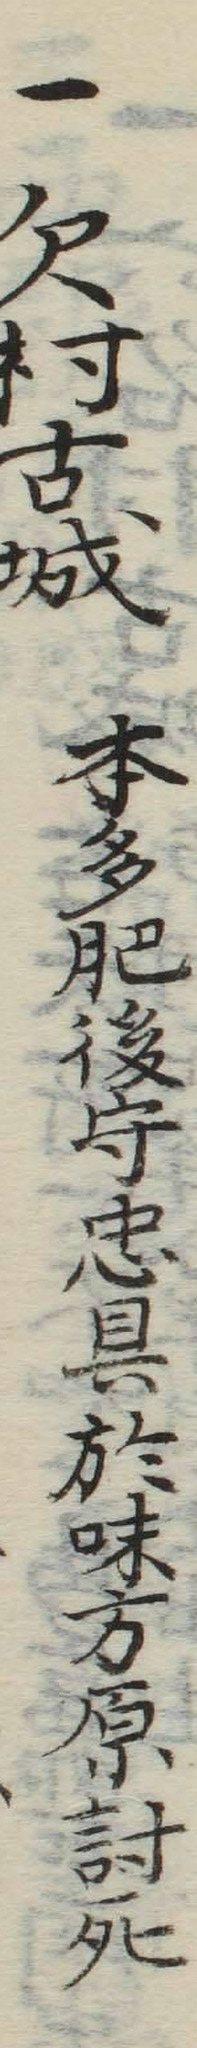一欠村古城本多肥後守忠具於味方原討死
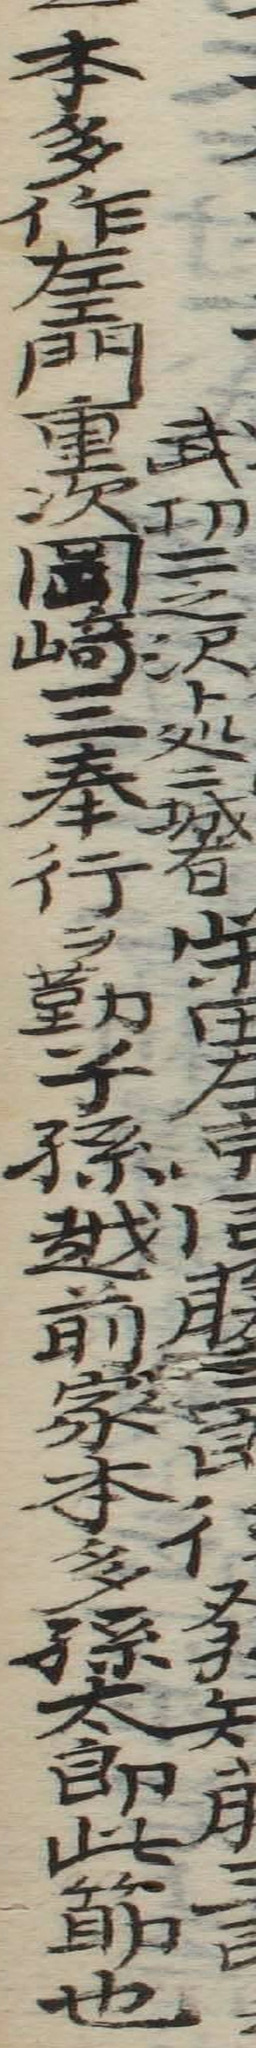△本多作左エ門重次岡崎三奉行ヲ勤子孫越前家本多孫太郎此節也

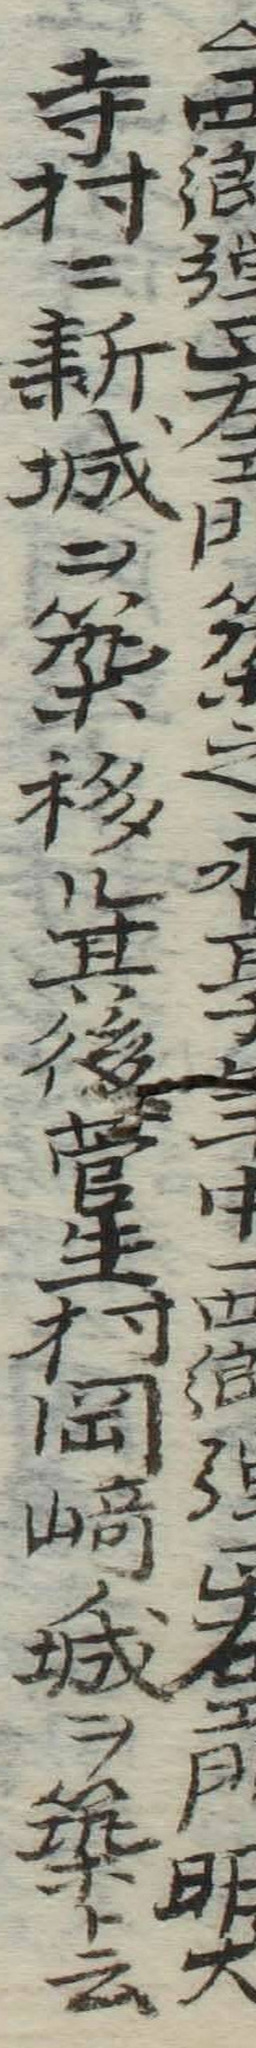寺村ニ新城ヲ築移ル其後菅生村岡崎ノ城ヲ築ト云
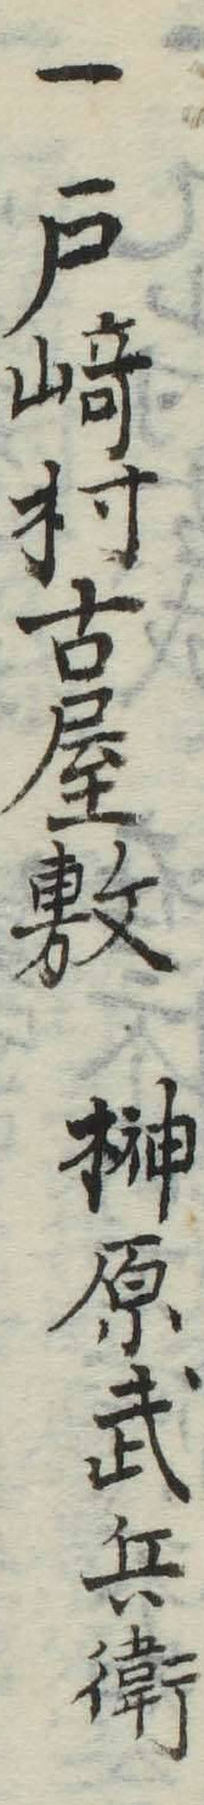一戸崎村古屋敷榊原武兵衛
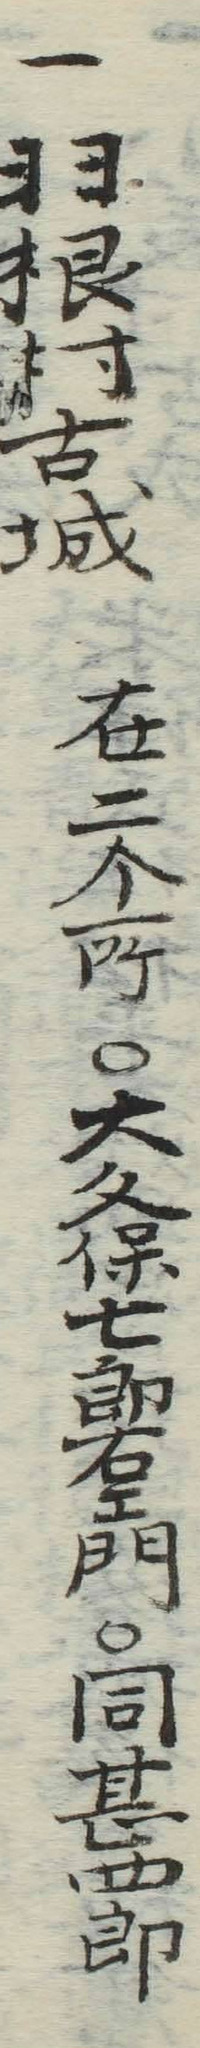一羽根村古城在二箇所○大久保七郎右エ門○同甚四郎
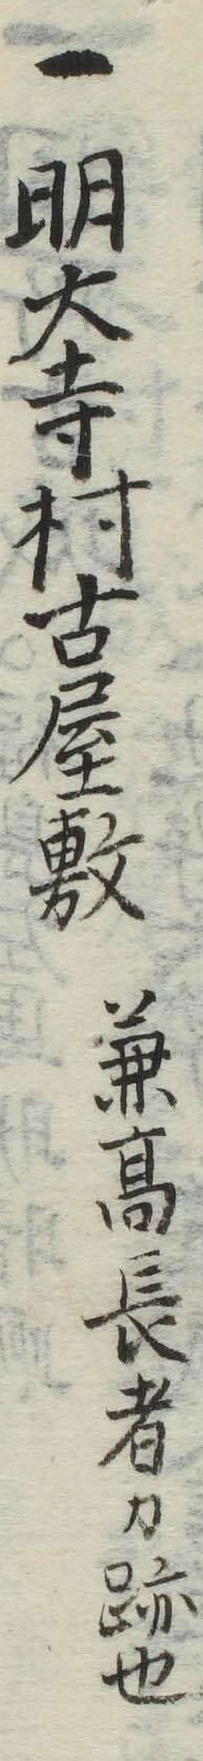一明大寺村古屋敷兼高長者カ跡也
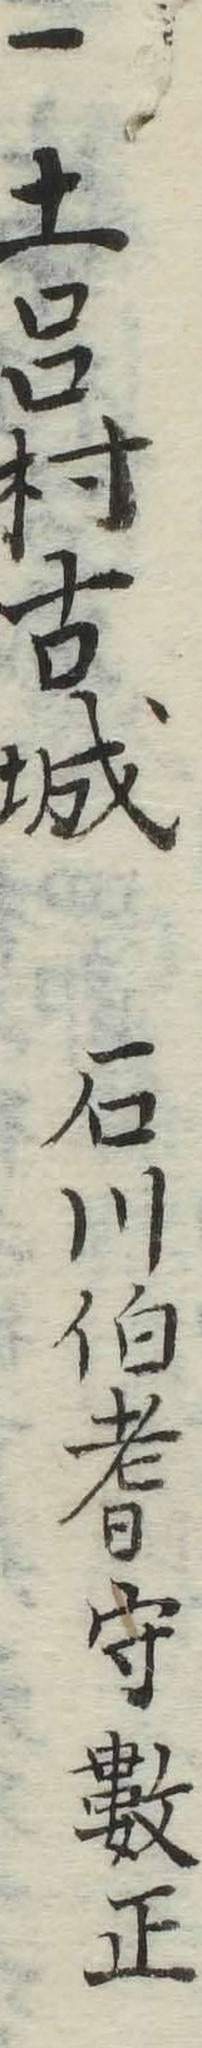一土呂村古城石川伯耆守数正
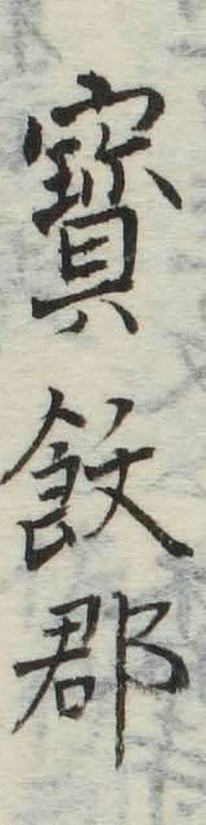宝飯郡
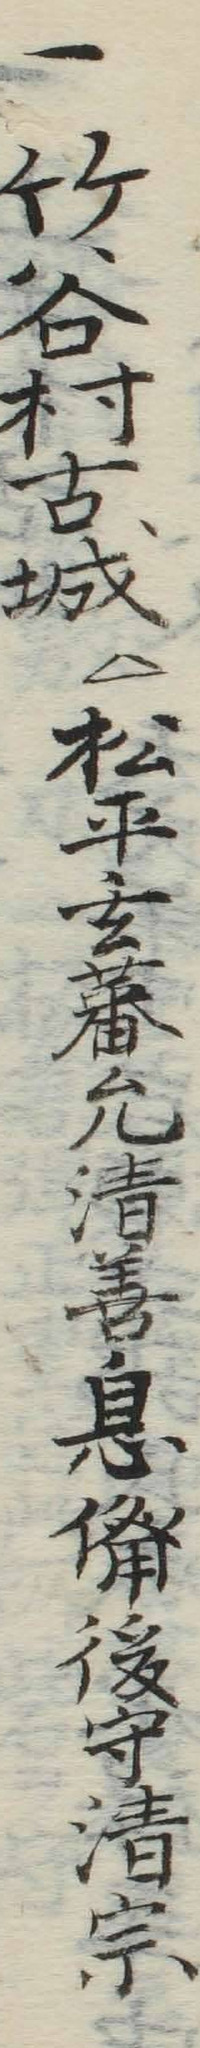一竹谷村古城△松平玄蕃允清善息備後守清宗

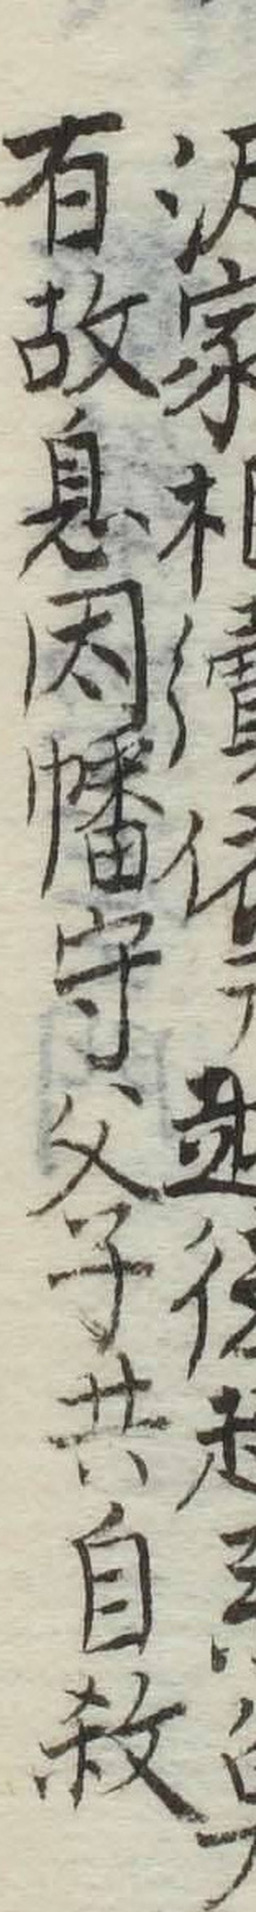有故息因幡守父子共自殺

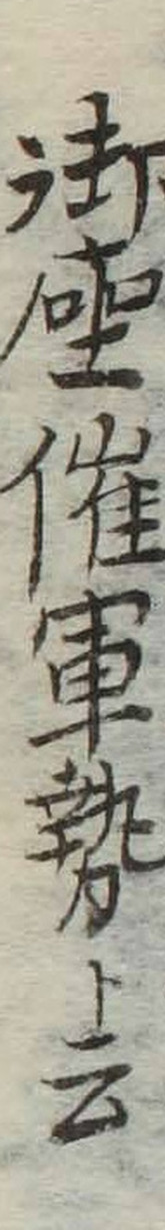御座催軍勢ト云
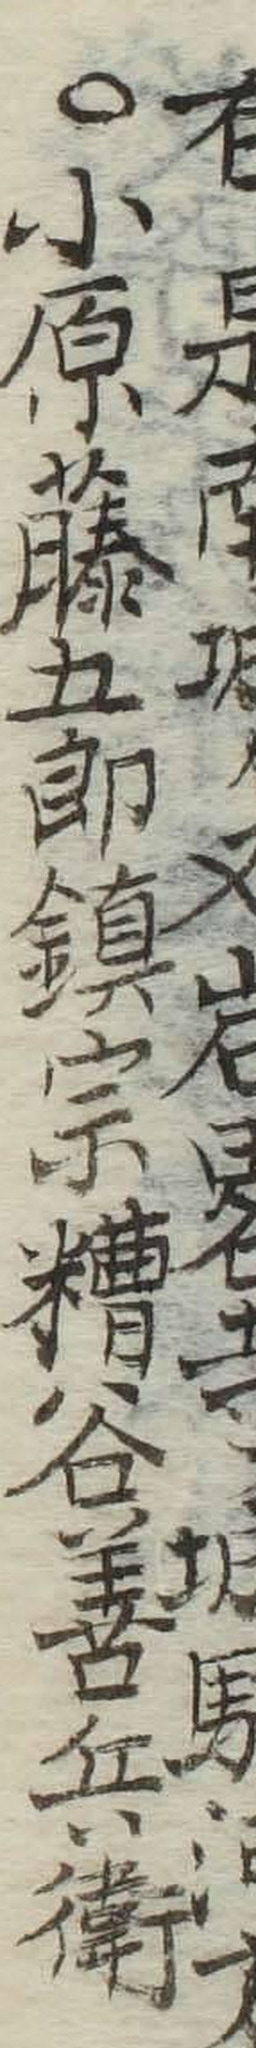○小原藤五郎鎮宗糟谷善兵衛
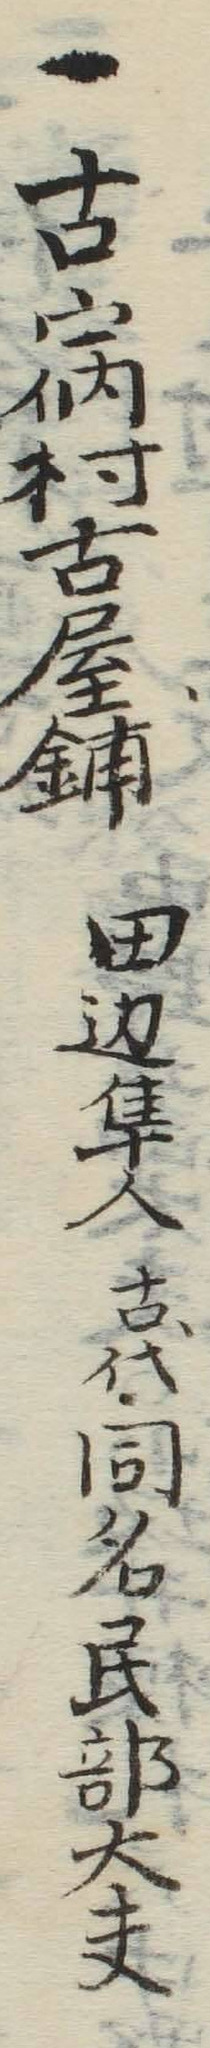一古宿村古屋鋪田辺隼人古代同名民部大夫
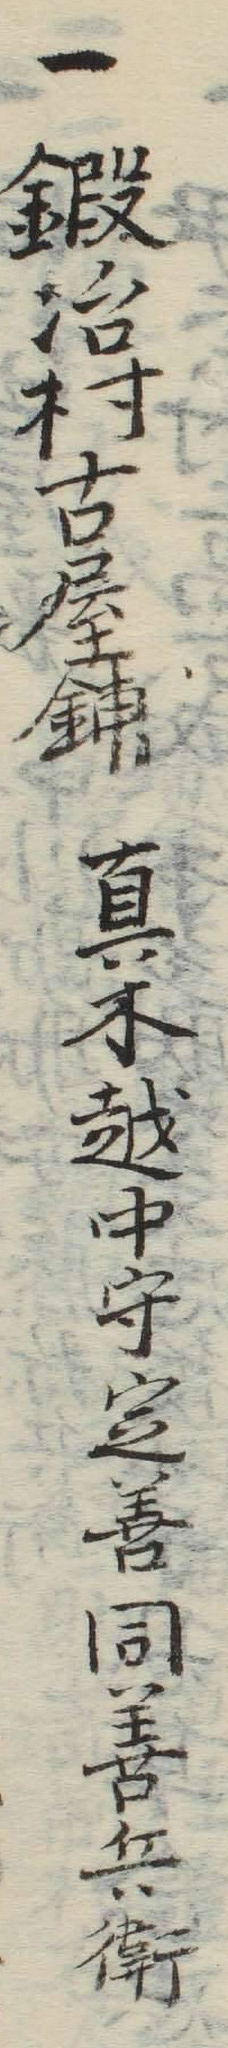一鍛冶村古屋鋪真木越中守定善同善兵衛
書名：三河国二葉松
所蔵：国文学研究資料館
